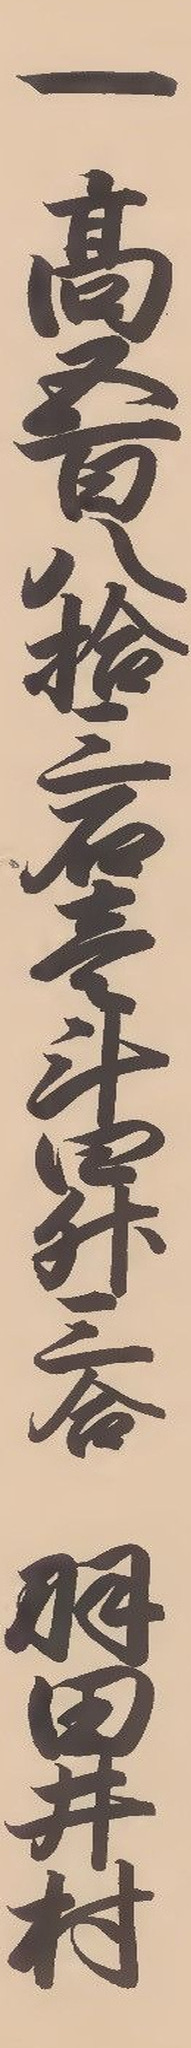一高五百八拾三石壱斗四升三合羽田井村
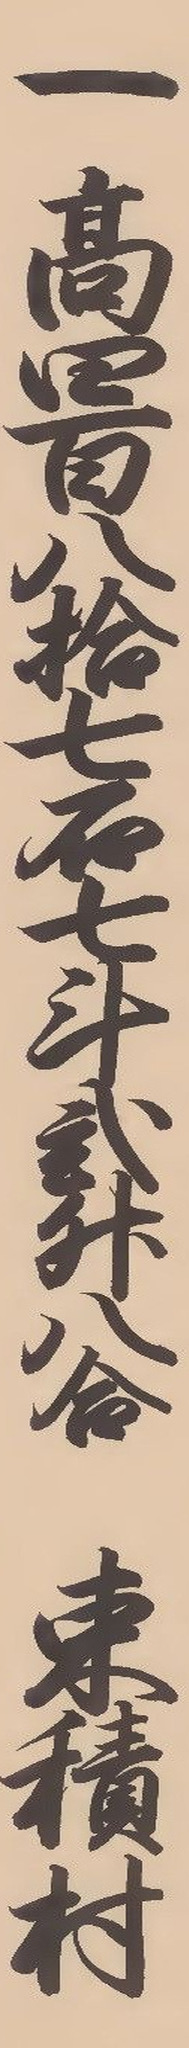一高四百八拾七石七斗弐升八合束積村
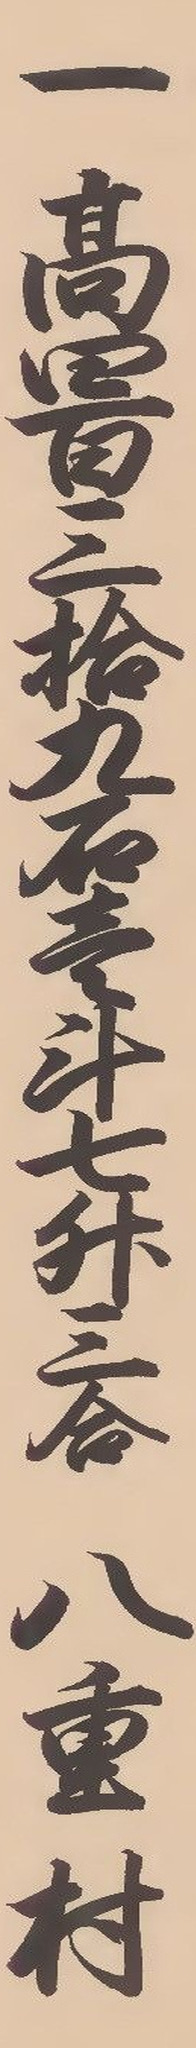一高四百三拾九石壱斗七升三合八重村
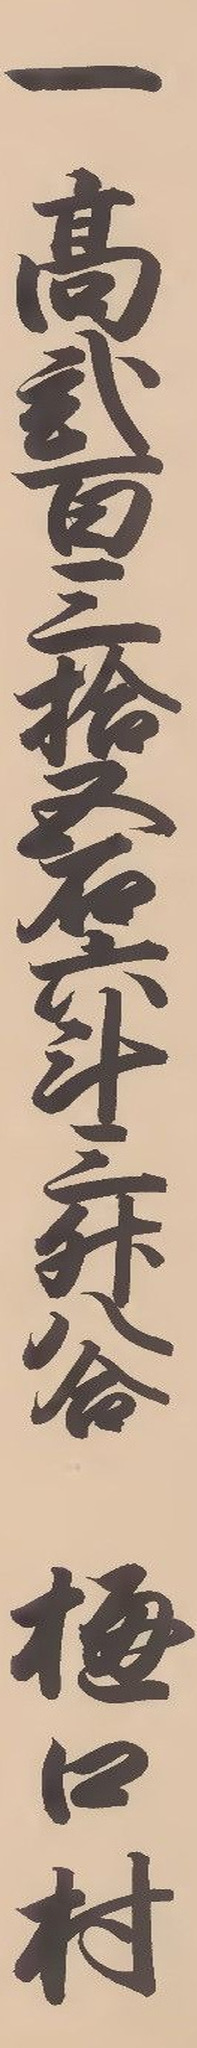一高弐百三拾五石六斗三升八合樋口村
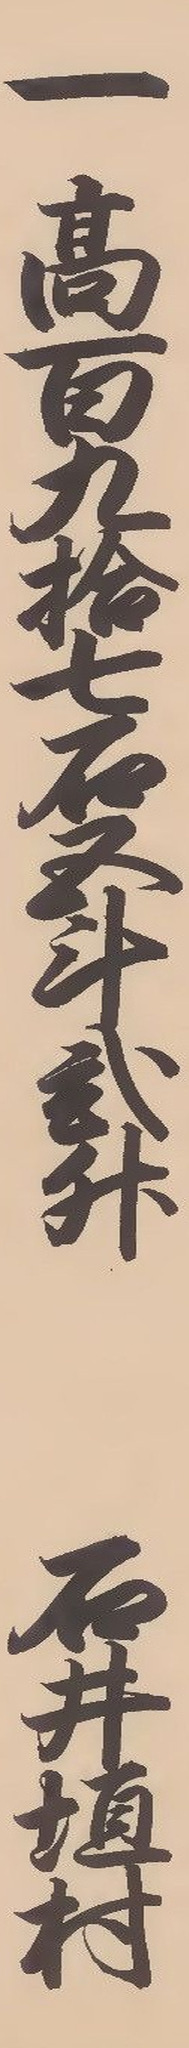一高百九拾七石五斗弐升石井垣村
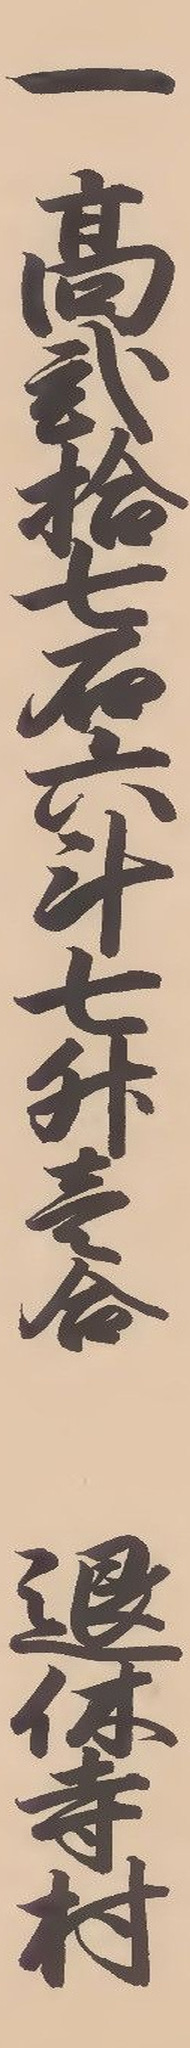一高弐拾七石六斗七升壱合退休寺村
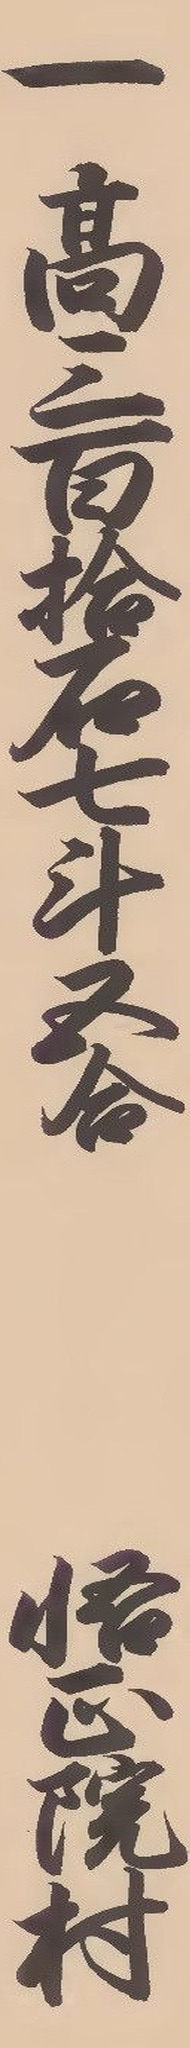一高三百拾石七斗五合悟正院村

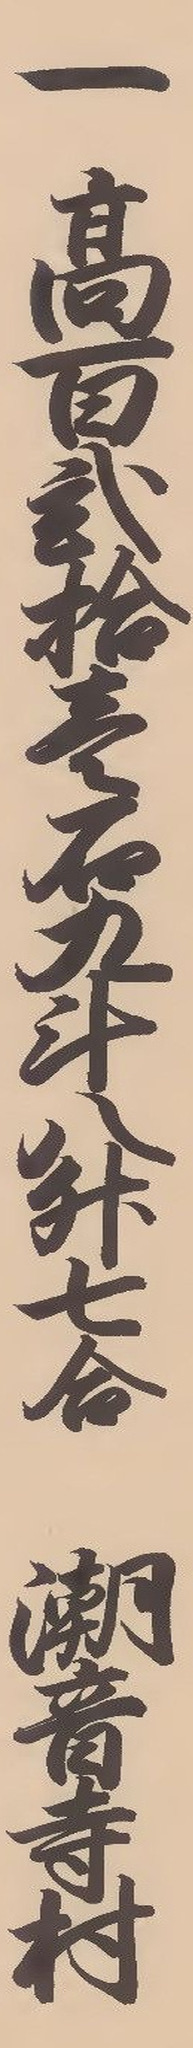一高百弐拾壱石九斗八升七合潮音寺村
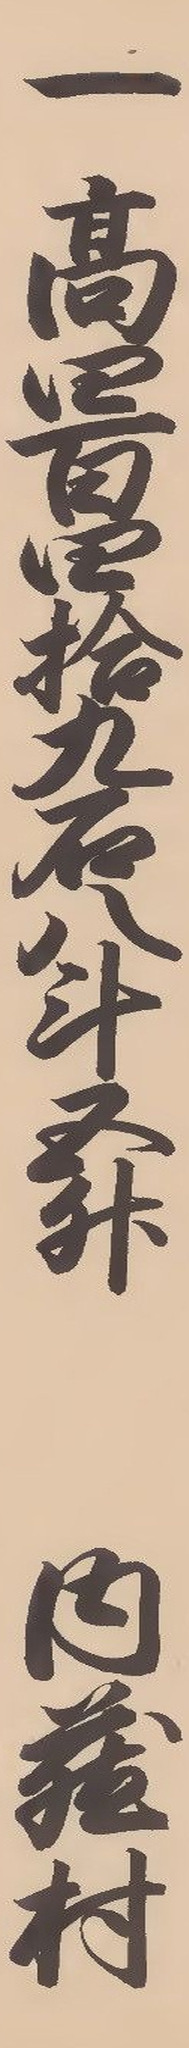一高四百四拾九石八斗五升内蔵村
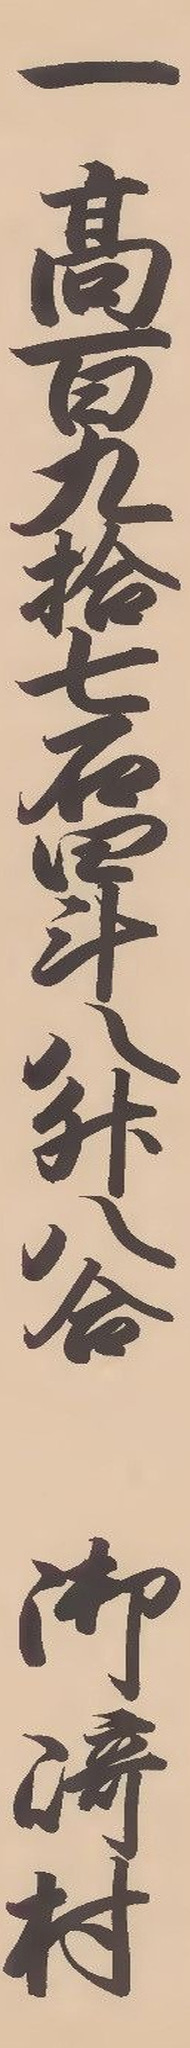一高百九拾七石四斗八升八合御崎村
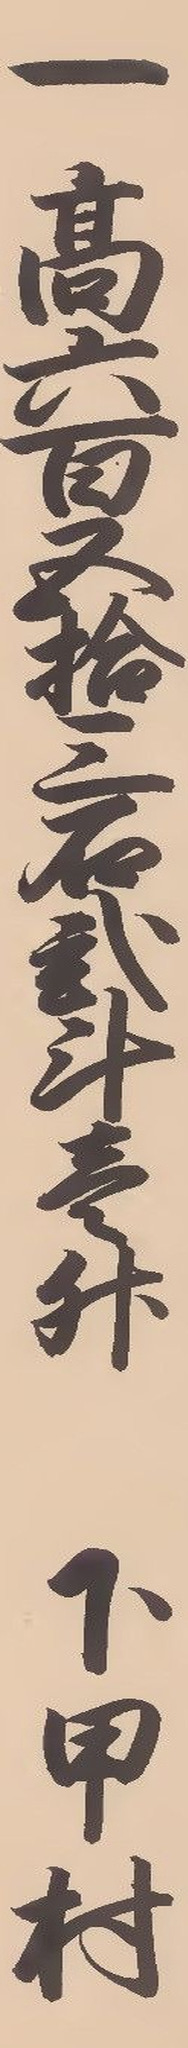一高六百五拾三石弐斗壱升下甲村
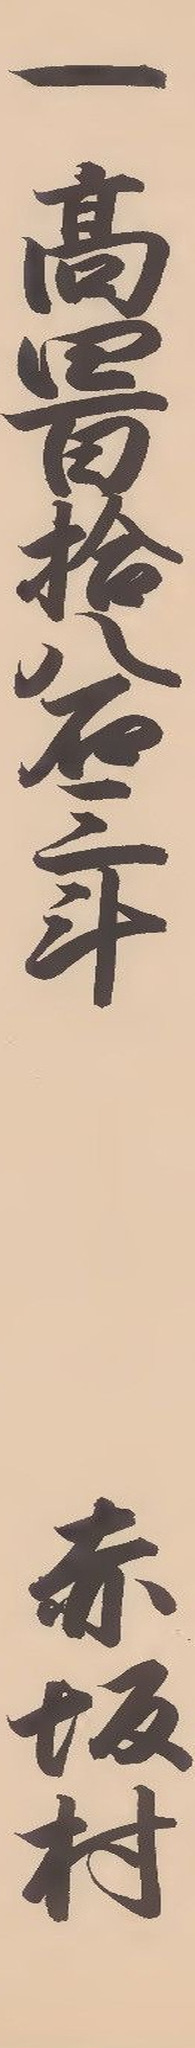一高四百拾八石三斗赤坂村
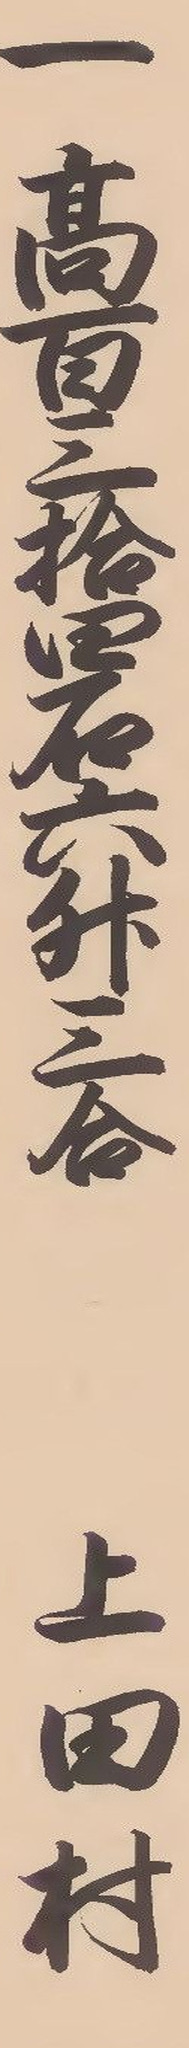一高百三拾四石六升三合上田村

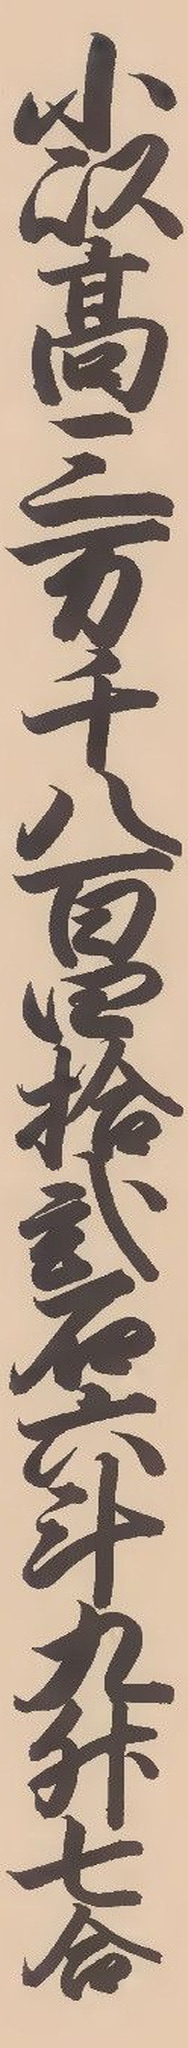小以高三万千八百四拾弐石六斗九升七合
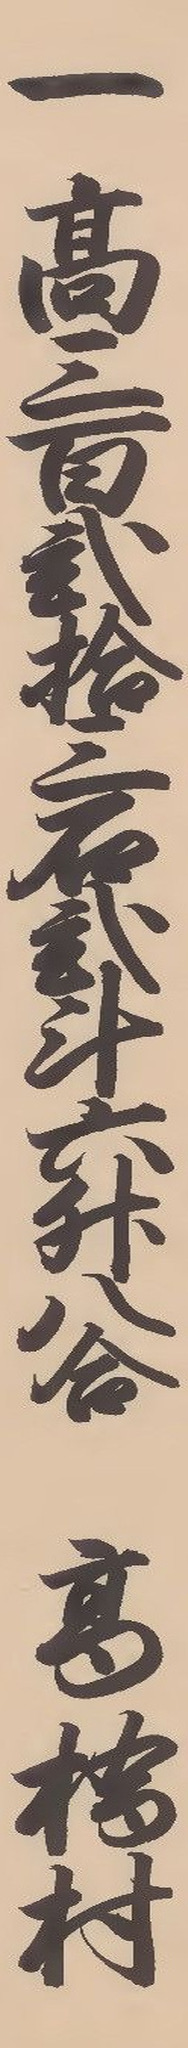一高三百弐拾三石弐斗六升八合高橋村
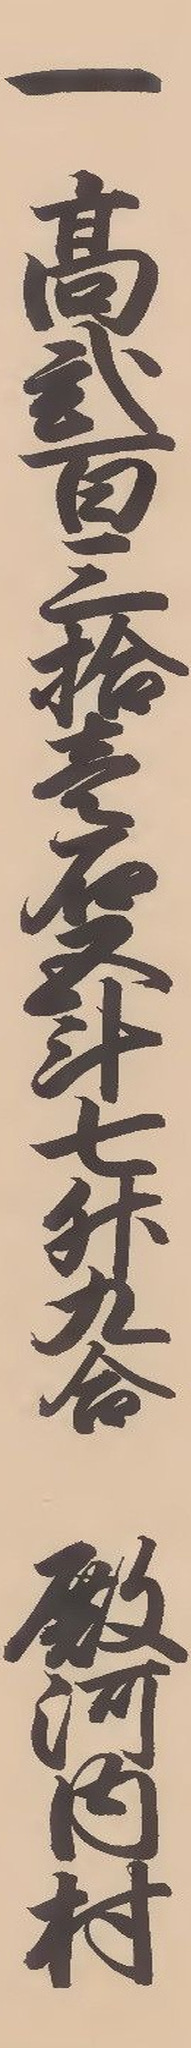一高弐百三拾壱石五斗七升九合殿河内村
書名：伯耆国郷帳
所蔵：国立公文書館 National Archives of Japan
